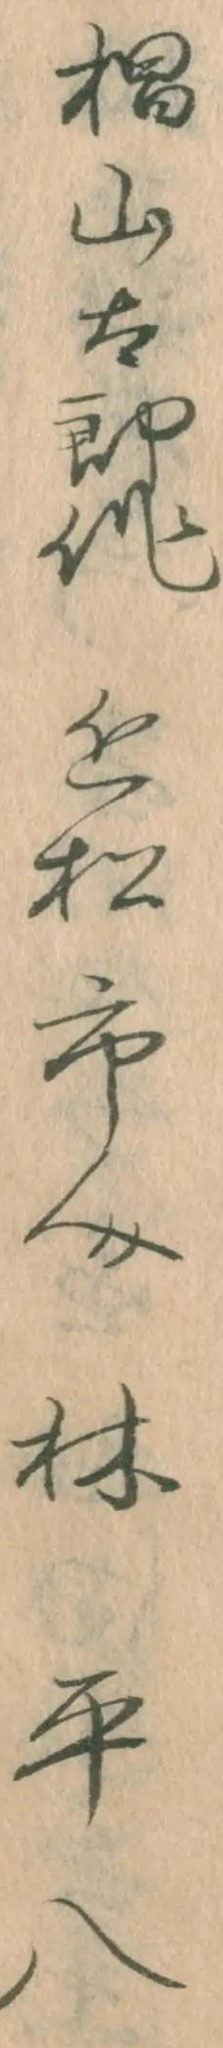椙山太郎作近松市介林平八
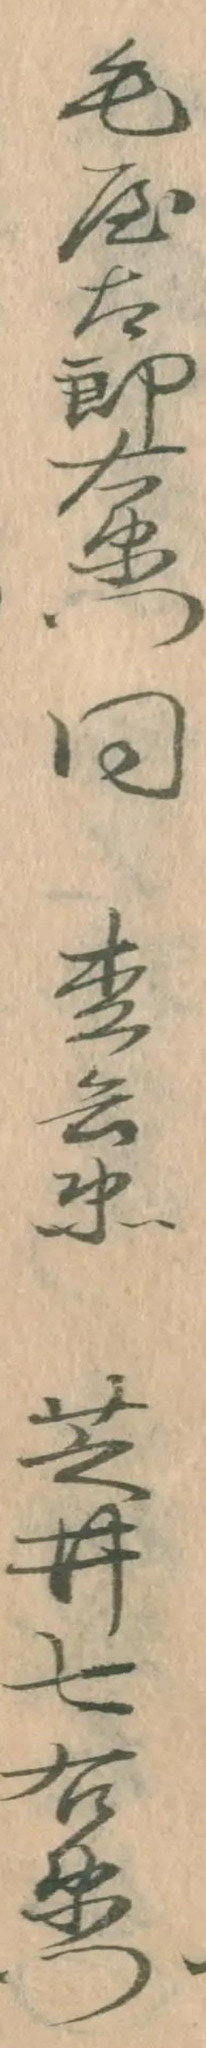毛屋太郎右衛門同杢兵衛芝井七右衛門
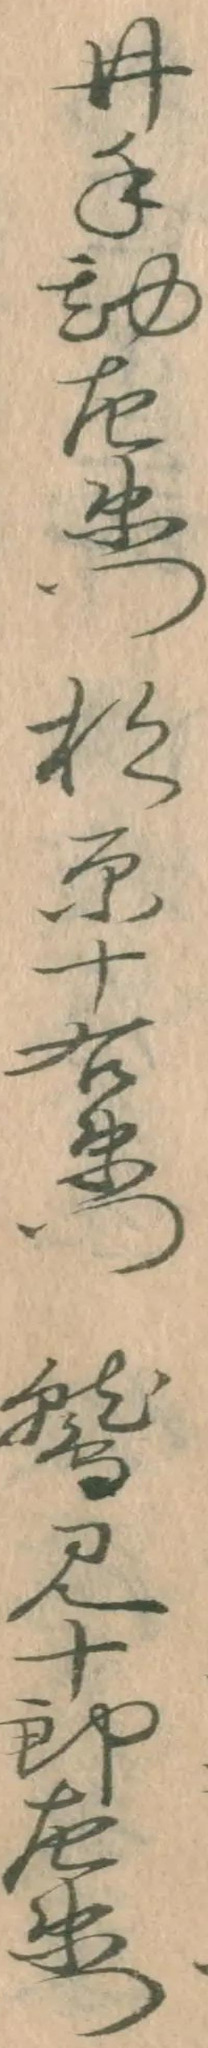井出勘左衛門杉原十右衛門鷲見十郎左衛門
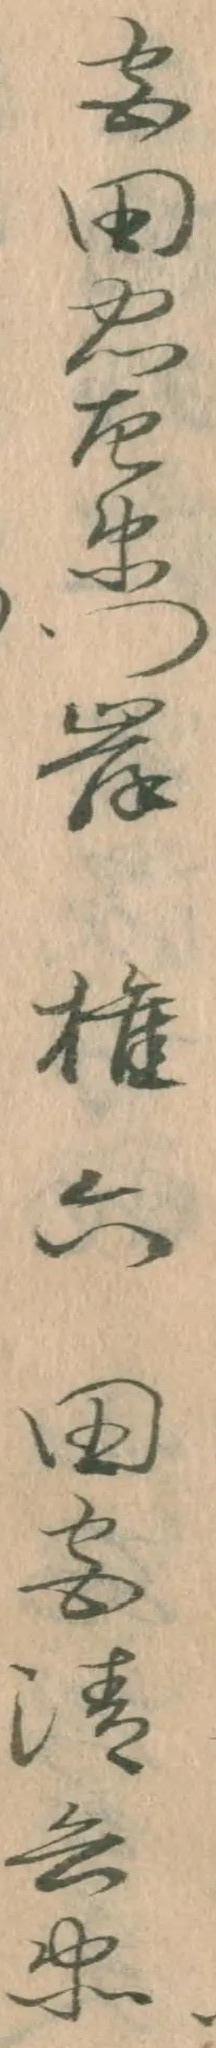宮田忠左衛門岸権六田宮清兵衛
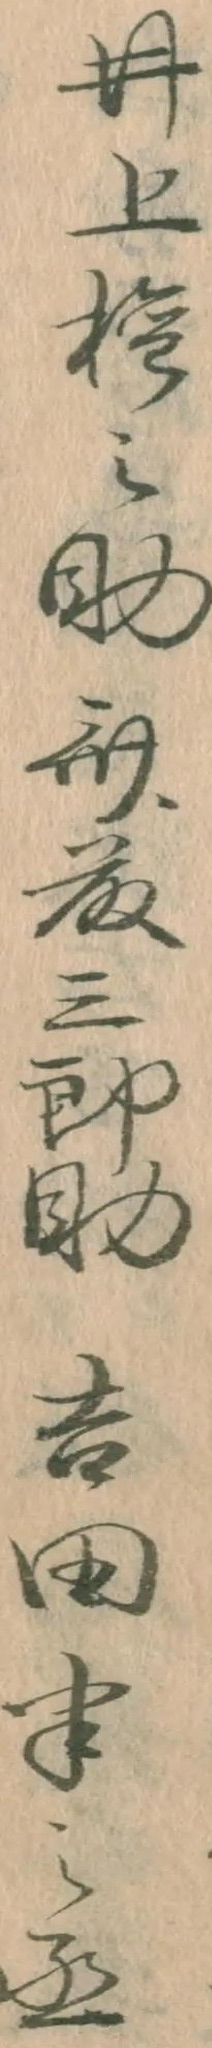井上権之助斎藤三郎助吉田半之丞
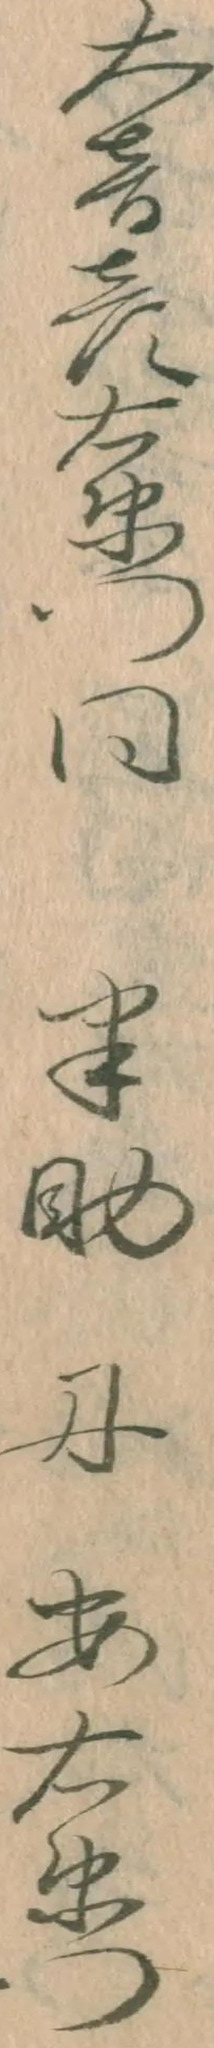大音彦右衛門同半助丹安右衛門
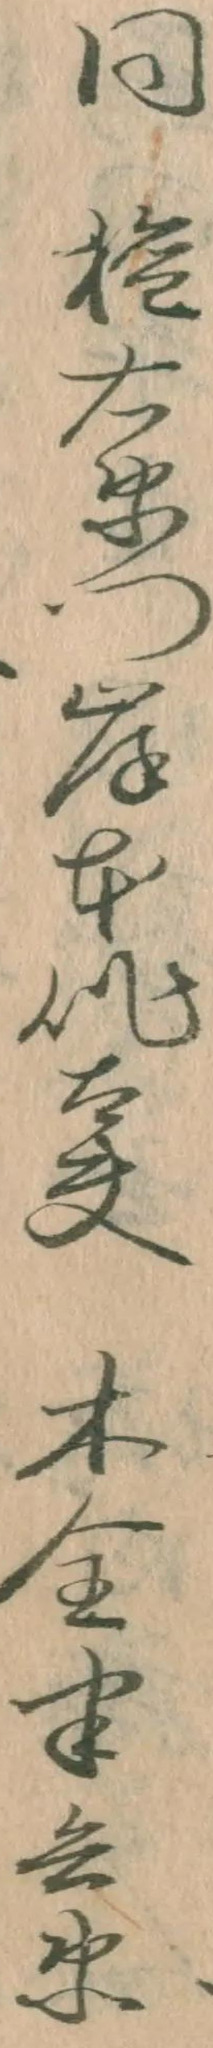同権右衛門岸元作太夫木金半兵衛
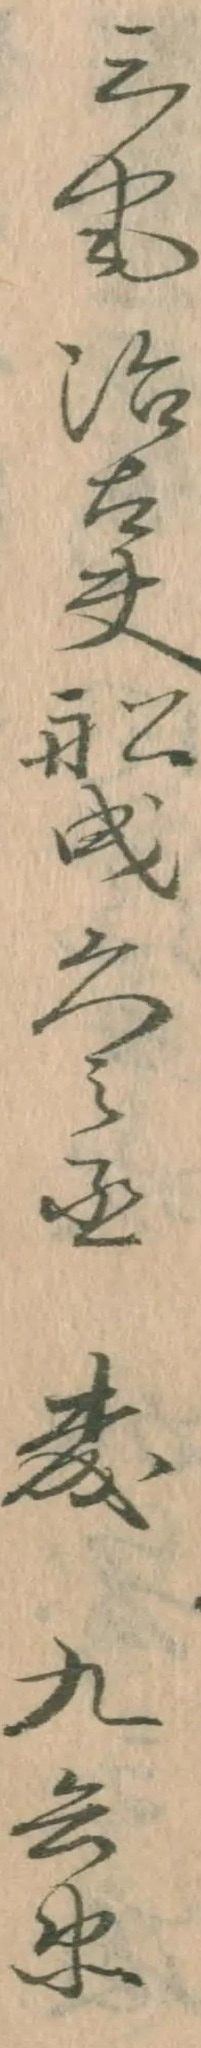三宅治太夫舩曳久之丞森九兵衛
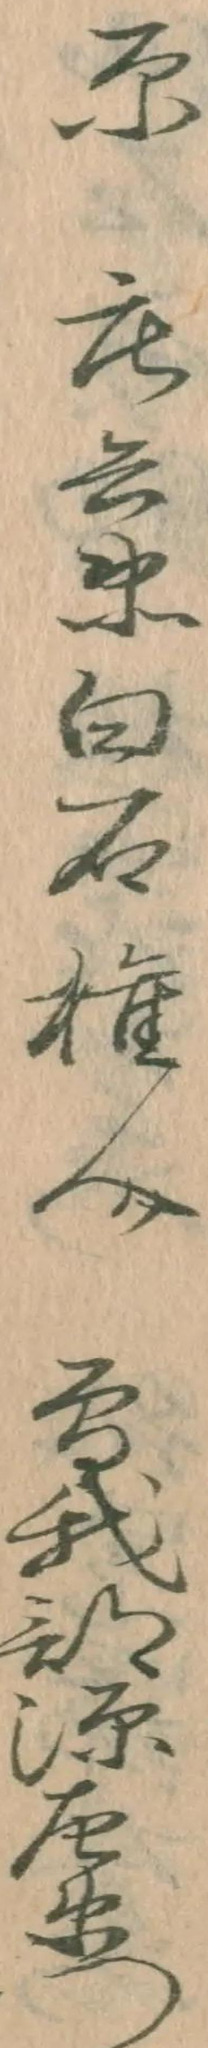原庄兵衛色石権介曽我部源左衛門
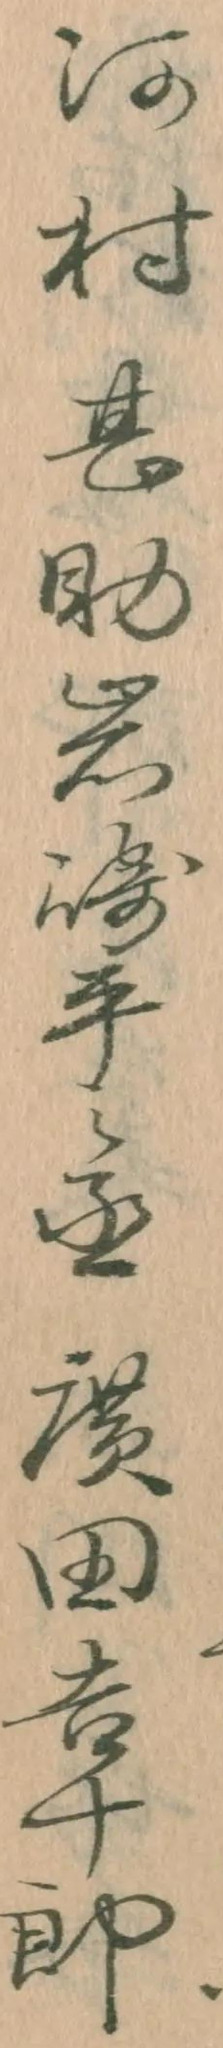河村甚助岸崎平之丞廣田吉十郎
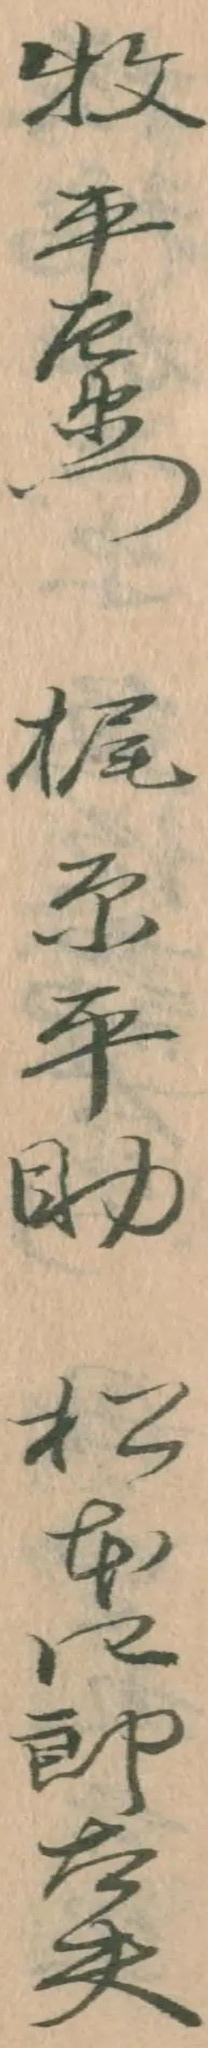牧平左衛門梶原平助松本四郎太夫
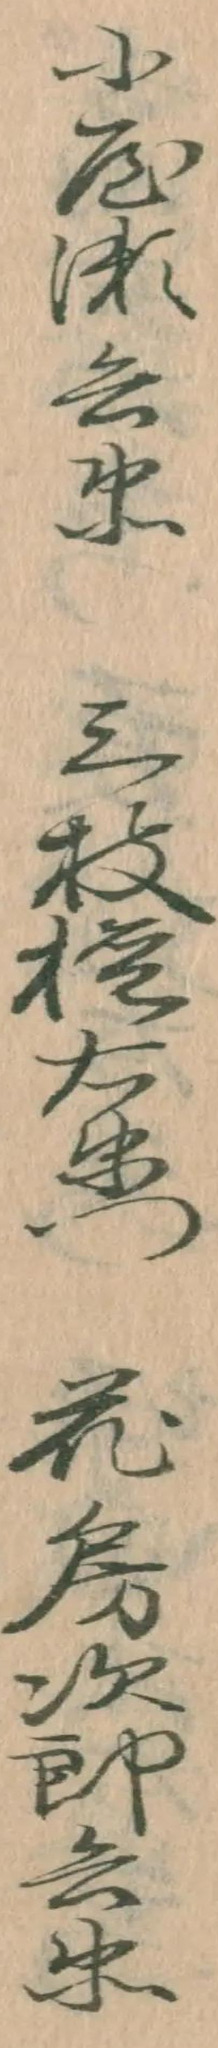小屋瀬兵衛三枝権右衛門花房次郎兵衛
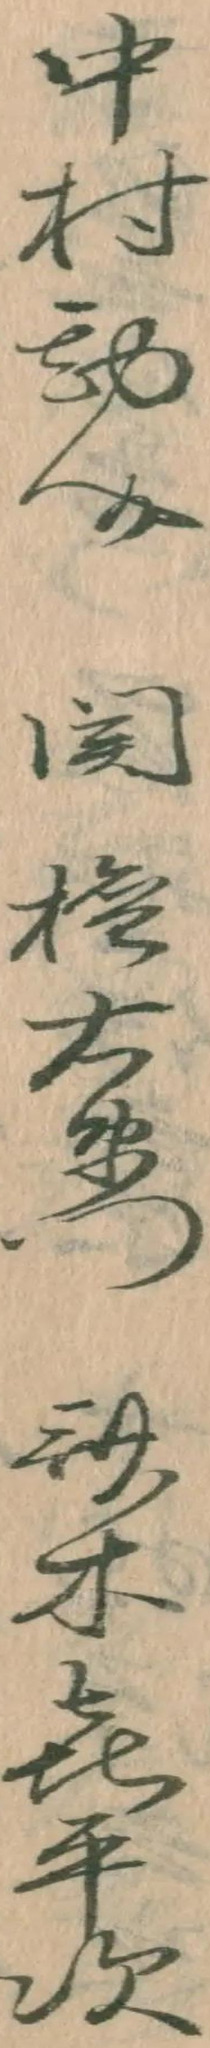中村勘介関権右衛門斉木喜平次
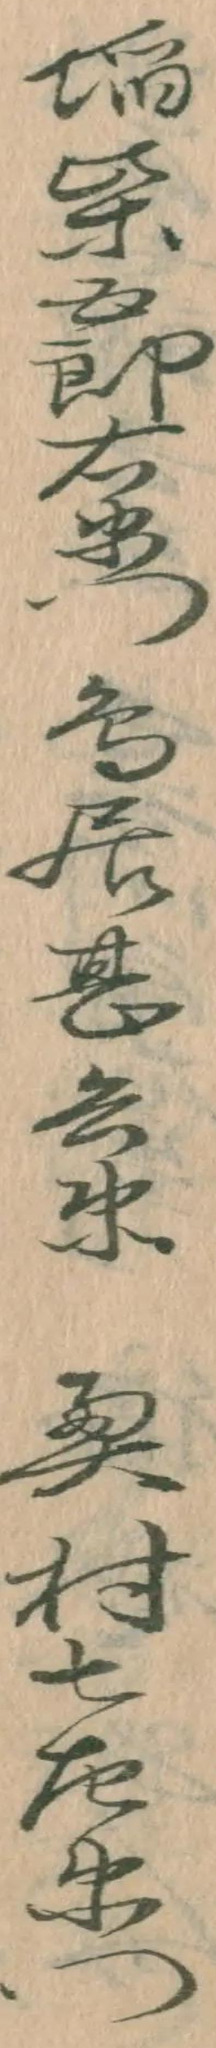稲芝五郎右衛門鳥居甚兵衛奥村七左衛門
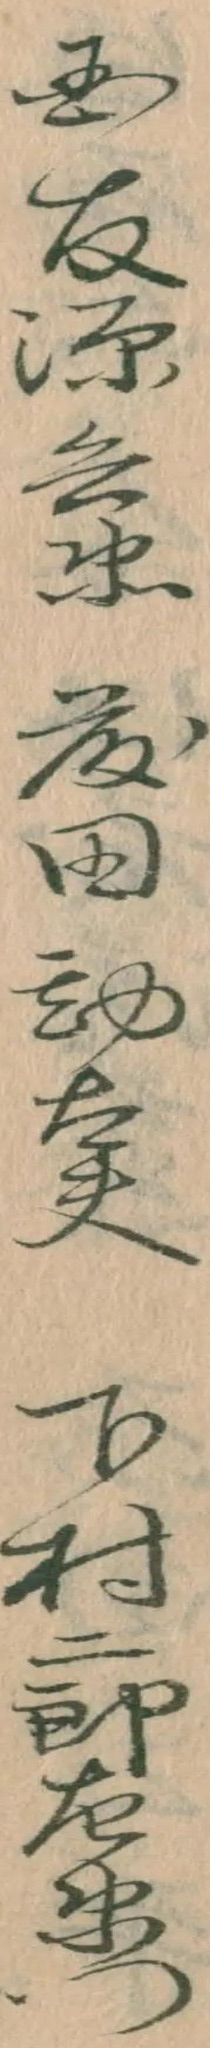国友源兵衛藤田勘太夫下村二郎右衛門
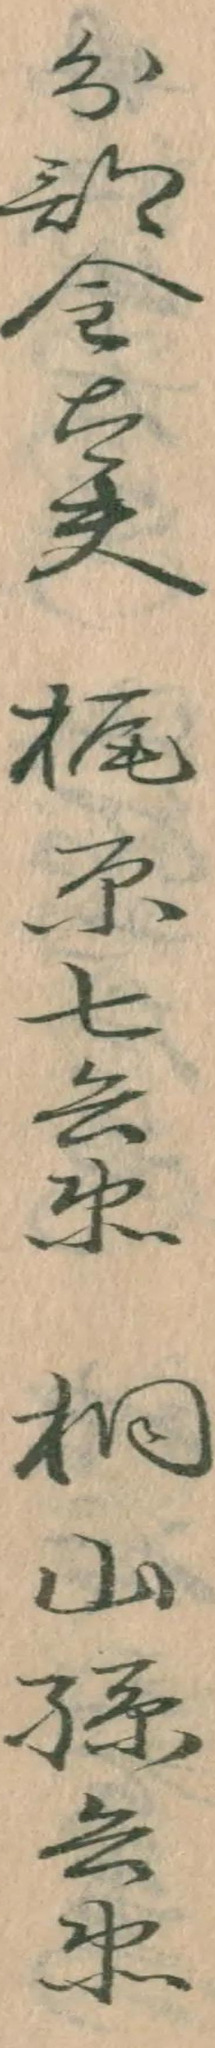分部金太夫梶原七兵衛桐山孫兵衛
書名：切支丹御退治記 49巻. [9]
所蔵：国立国会図書館 National Diet Library, JAPAN
